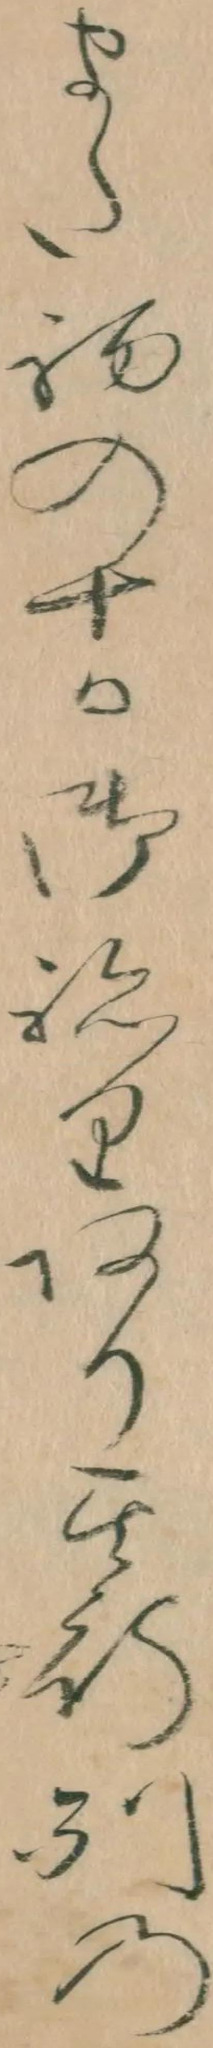また初の十日御ねりあり其行列の

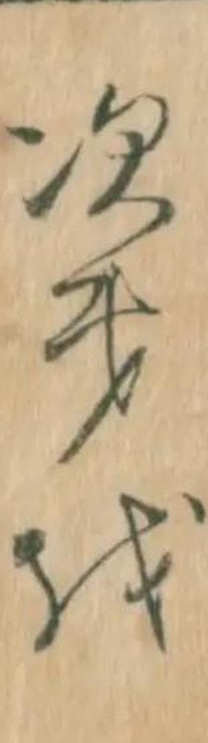次第を
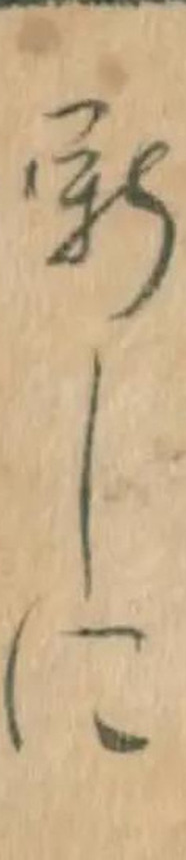噺しに
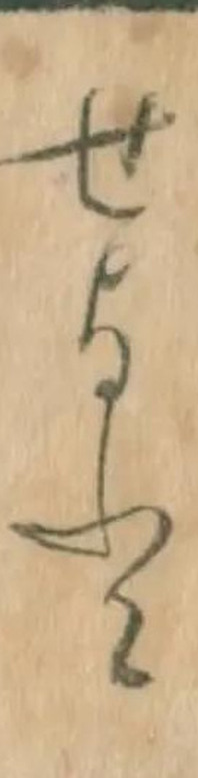せよと
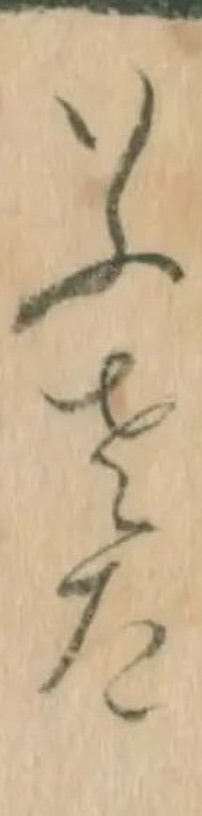いふさた
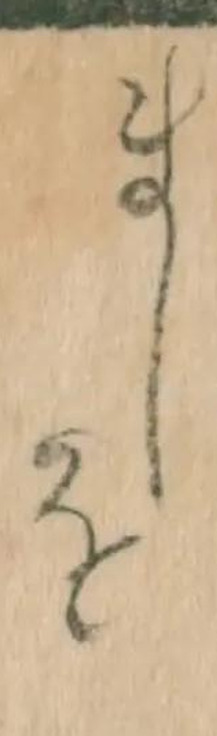ましを
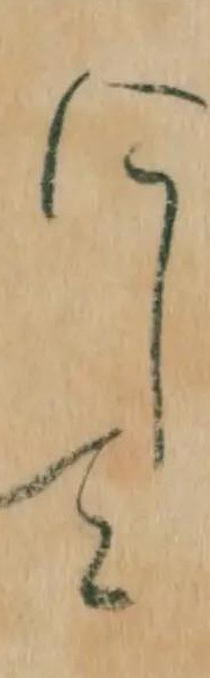にして
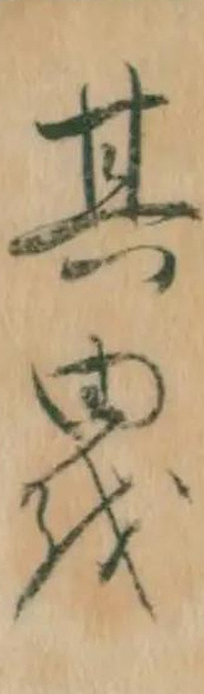其由を

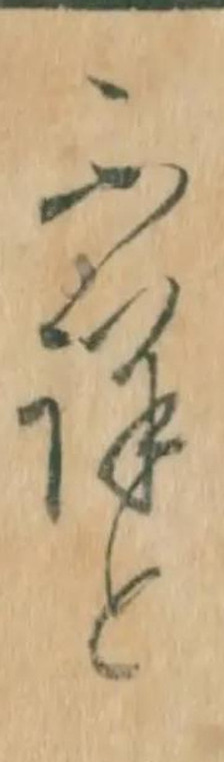不詳と
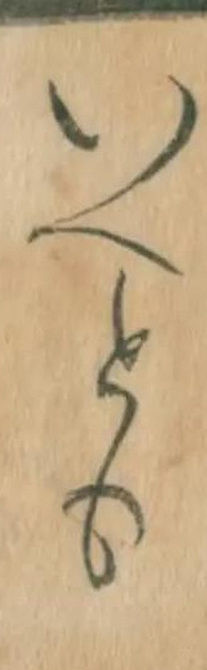いへとも
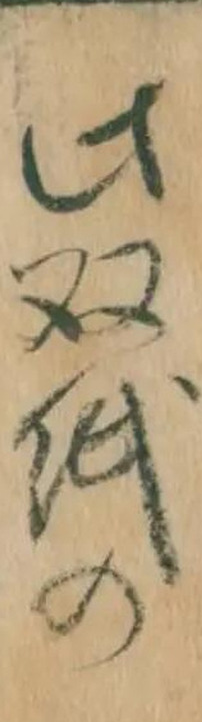此双紙の

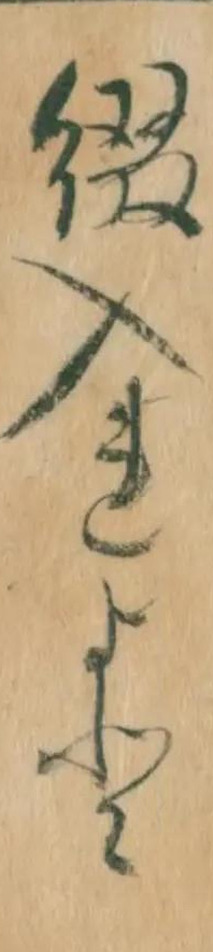綴入れよと
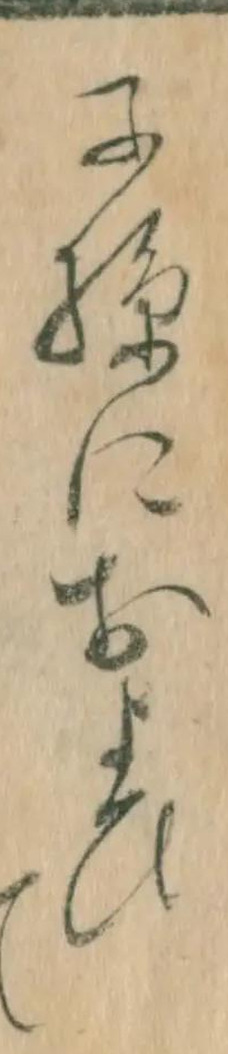子孫におよひて
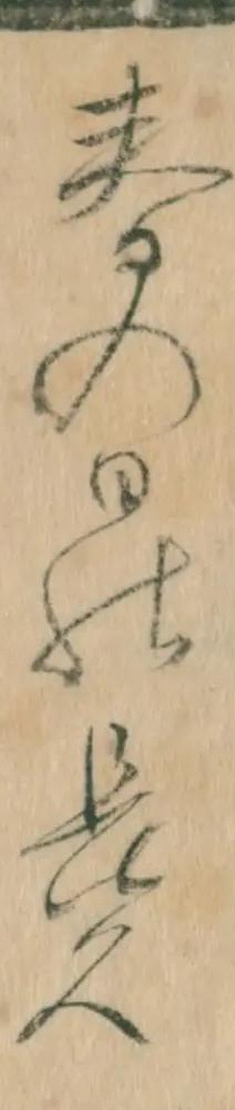春の日の長く
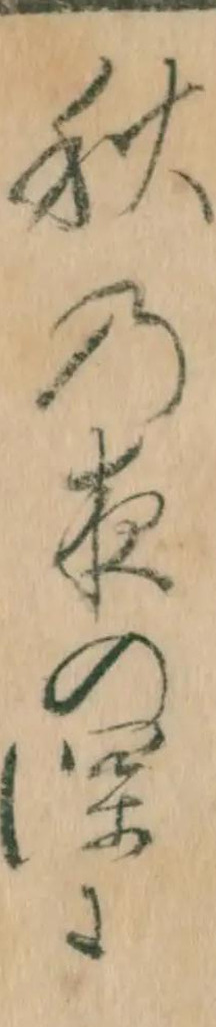秋の夜の深に
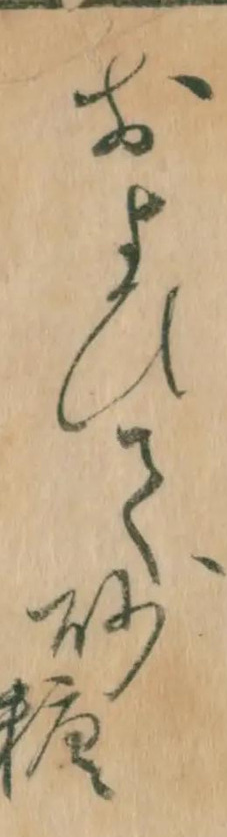およひて砂糖
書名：俗語之種. [2]
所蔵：国立国会図書館 National Diet Library, JAPAN
